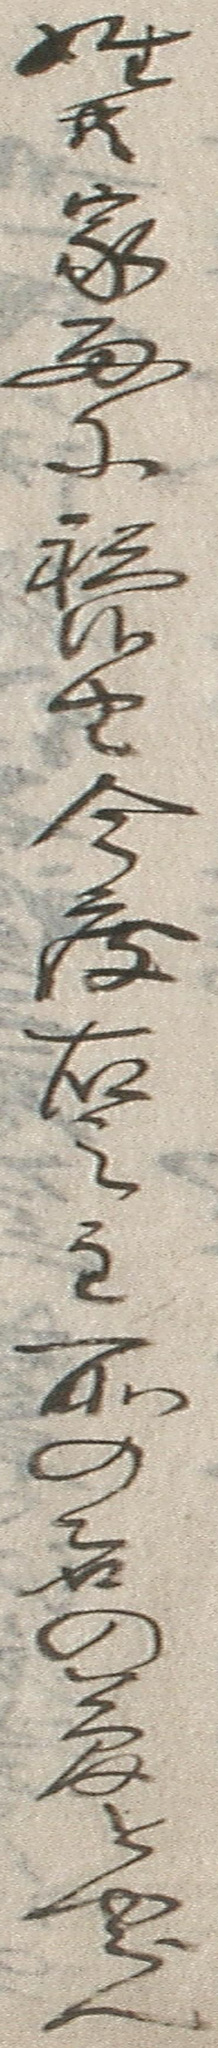姓共家毎に祝候由今度右之主所の者の夢とやらん
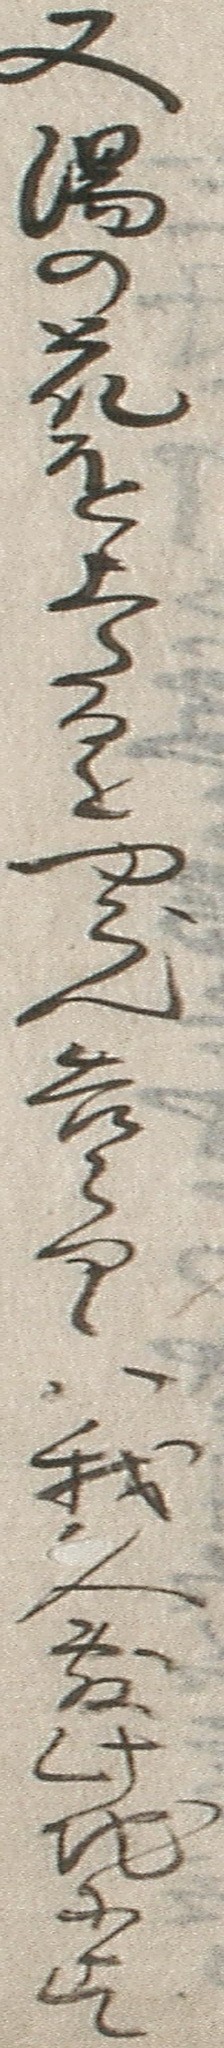又湯の花を上たるをやらん告らるゝは我久敷此地にす
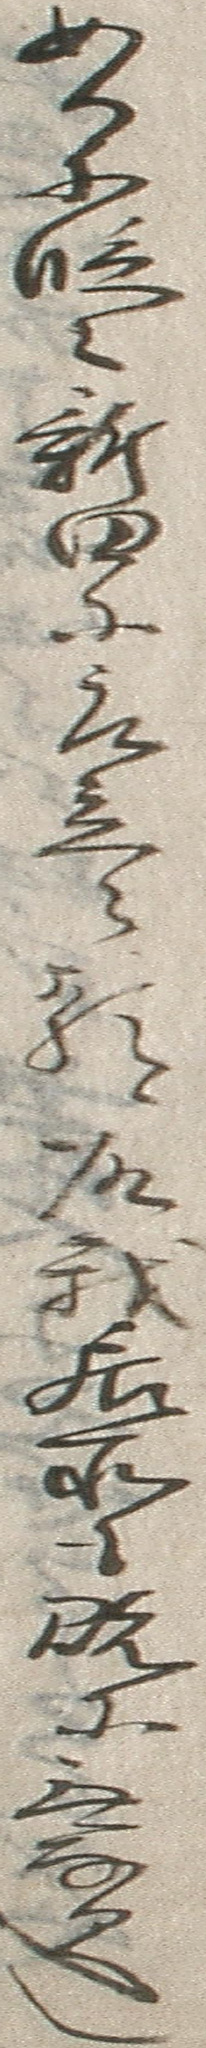めりに段々新田に取立らるゝ故我居所も既に無なるへし
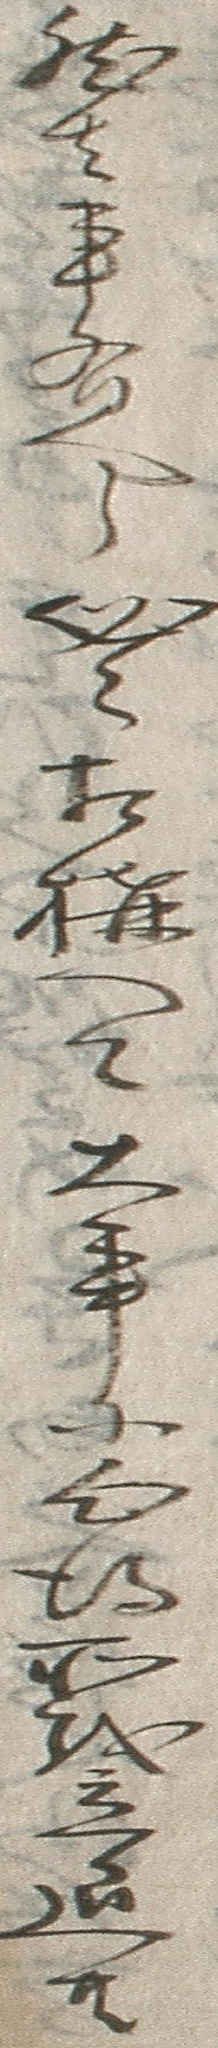然は事有へし必々相構へて大事に心得所を立退共
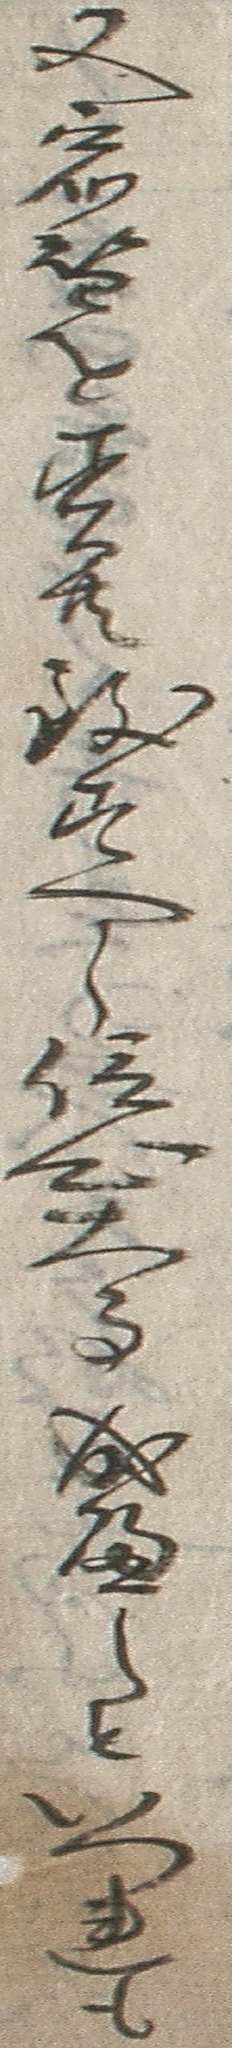又宿替をする共致すへし信心大事成へしといつれも

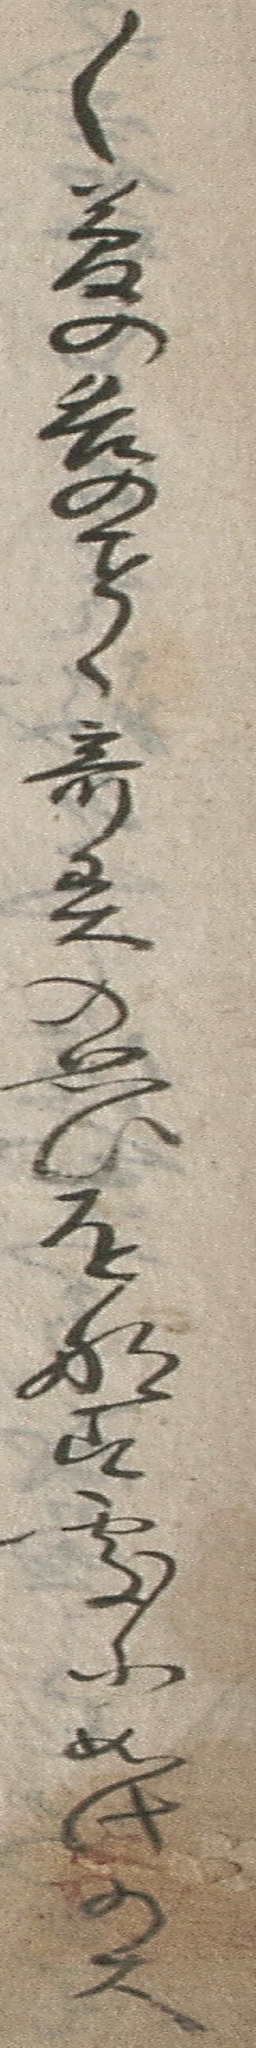〳〵夢の告のことく奇異の思ひをなす処に如此の大
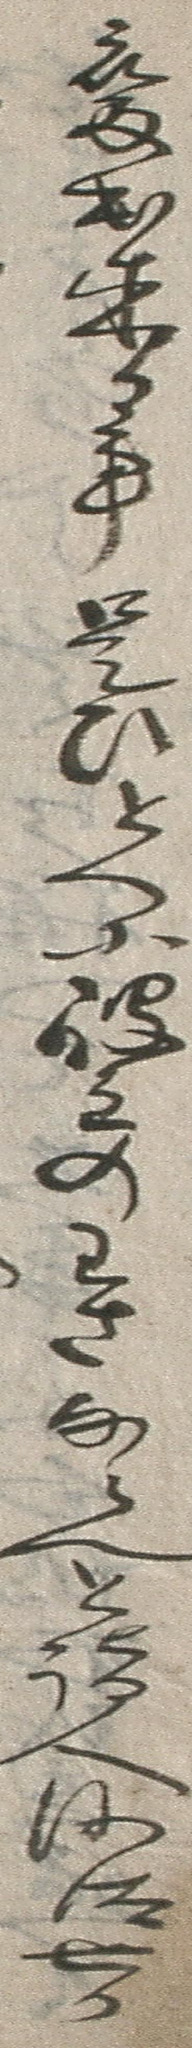変出来る事是ひとへに彼主のわさならんと諸人沙汰せり
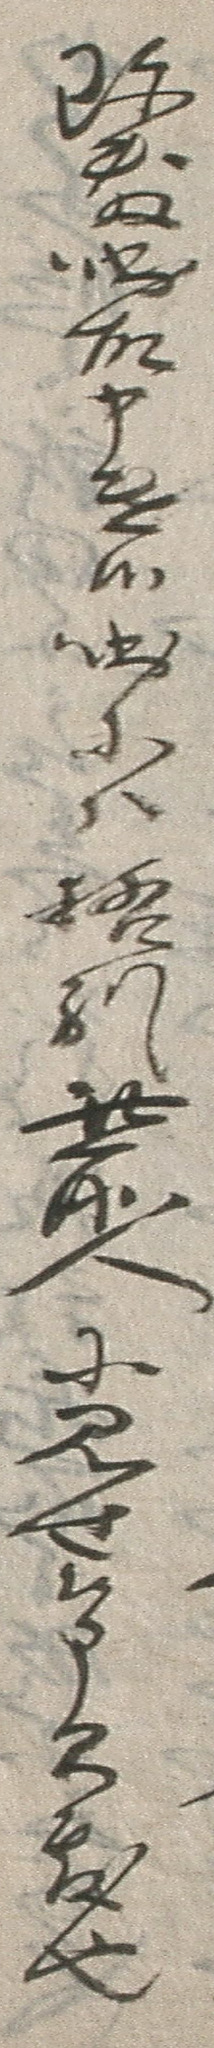珍敷咄故申遣候咄には格別此所人に見せ被申間敷也
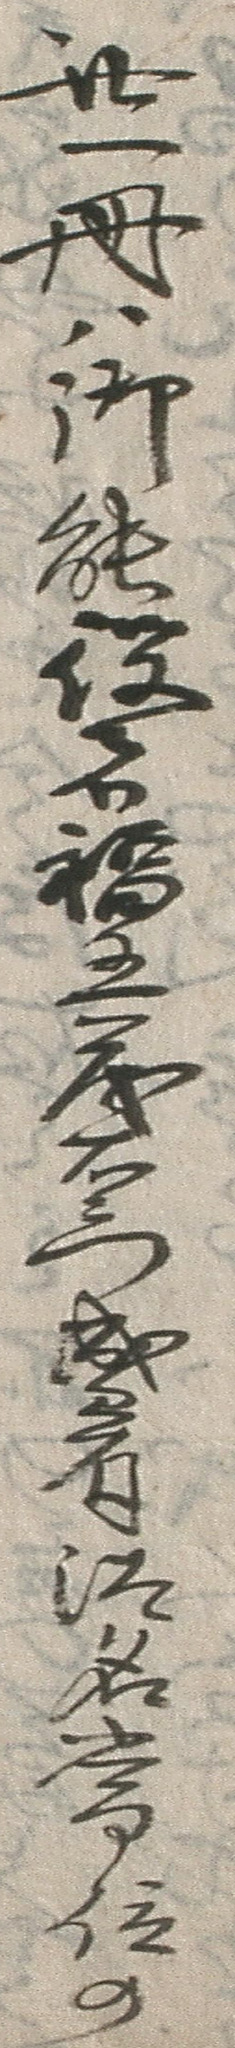此一冊は御能役者福王茂右衛門盛有法名常位の
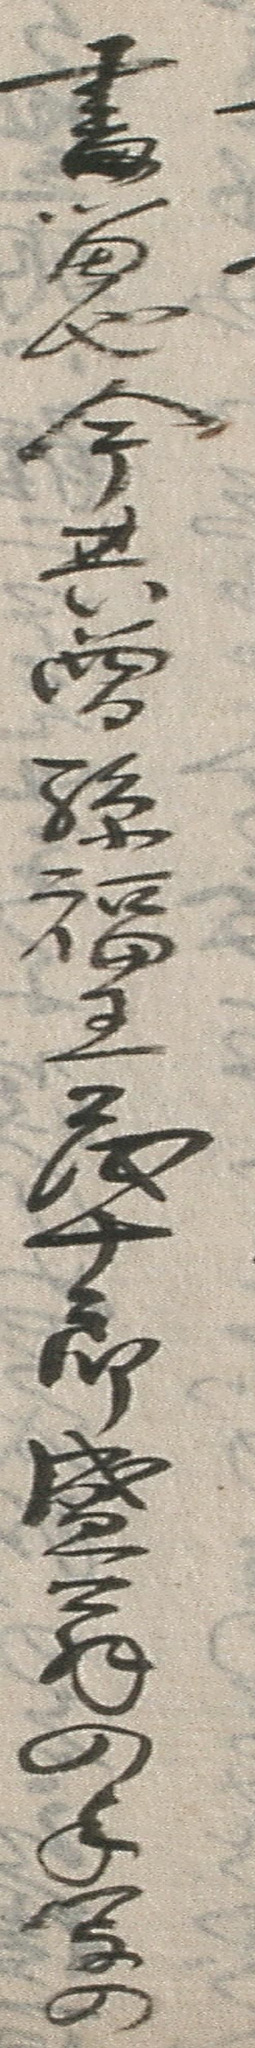書留也今其曽孫福王茂十郎盛扇の手写の
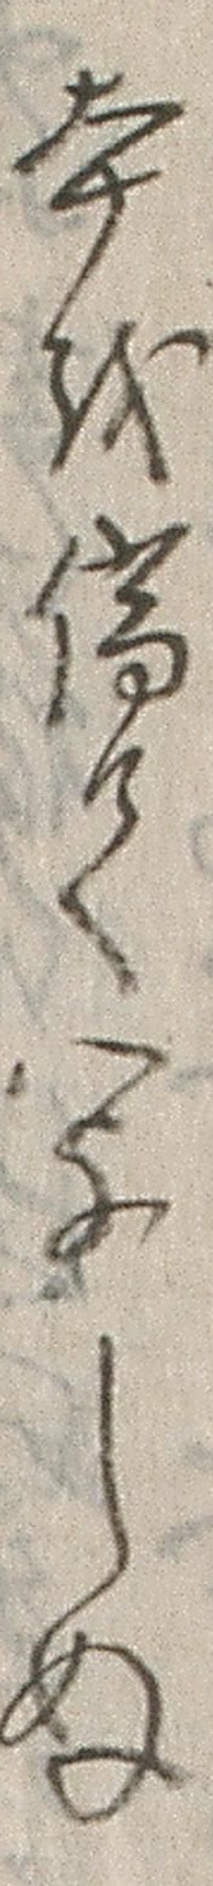本を借て写しぬ
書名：享保十三年江戸洪水記
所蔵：東京大学地震研究所図書室 Earthquake Research Institute Library, The University of Tokyo, JAPAN
